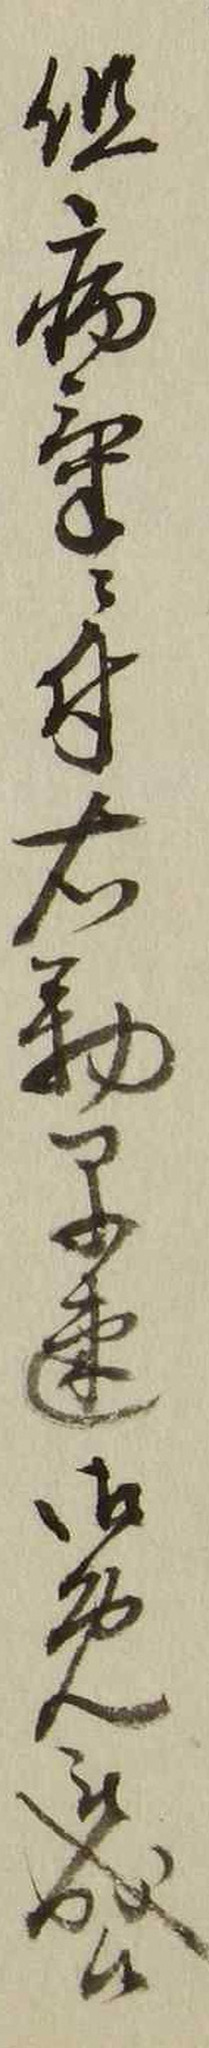但病気付ニ右勤早速御免被成候
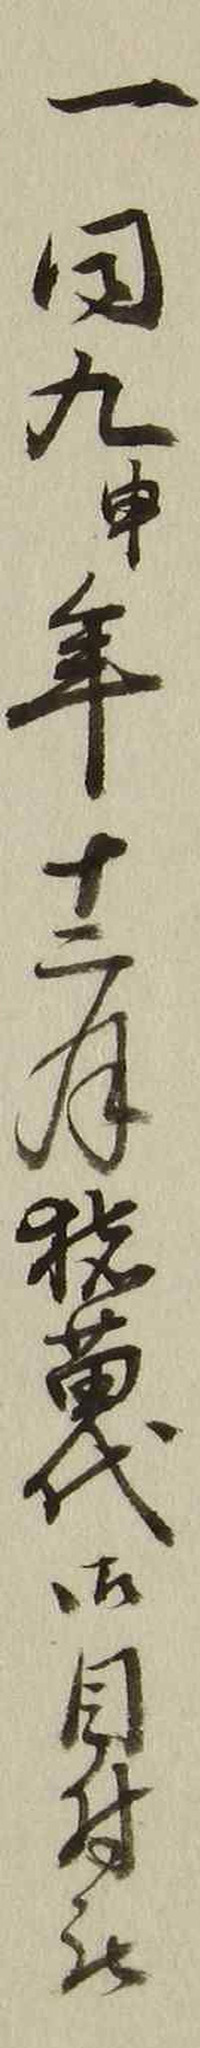一同九申年十二月猪苗代御目付被
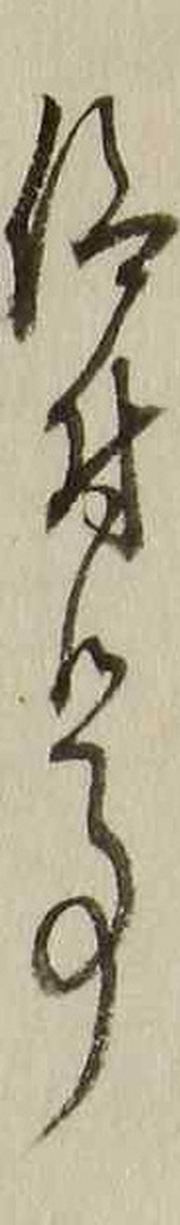仰付候事
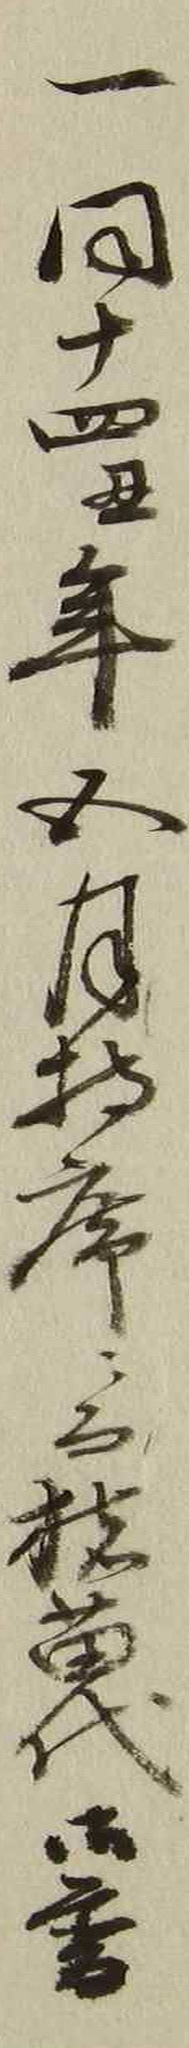一同十四丑年五月持席ニ而猪苗代御普
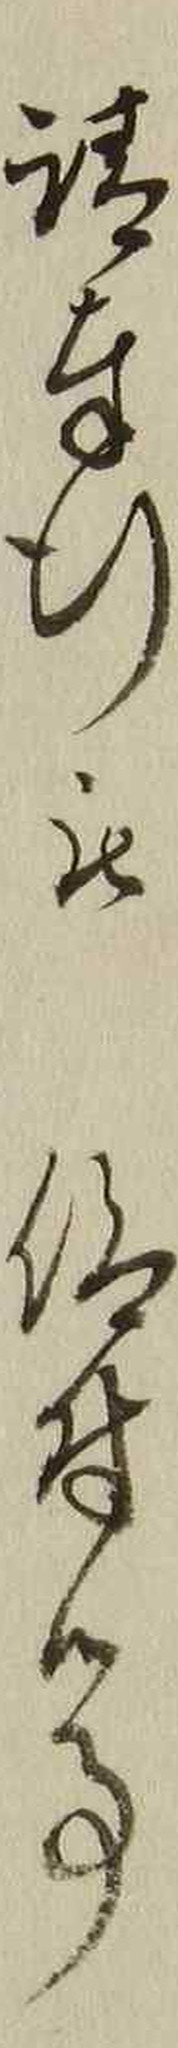請奉行被仰付候事
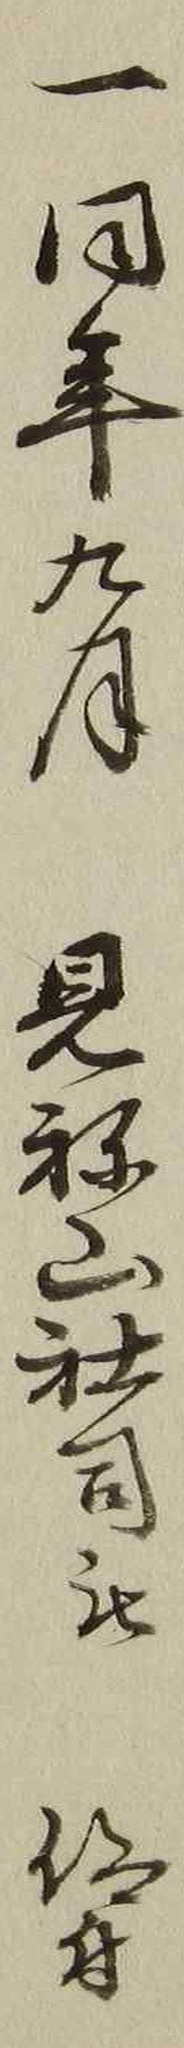一同年九月見禰山社司被仰付
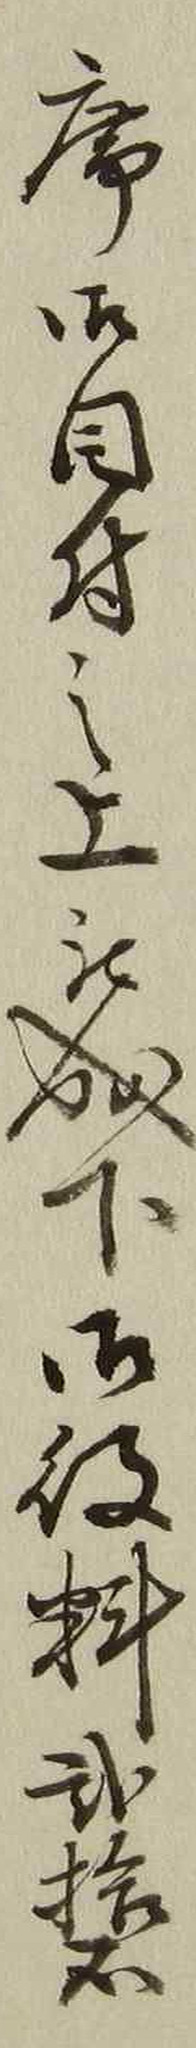席御目付之上被成下御役料弐拾石
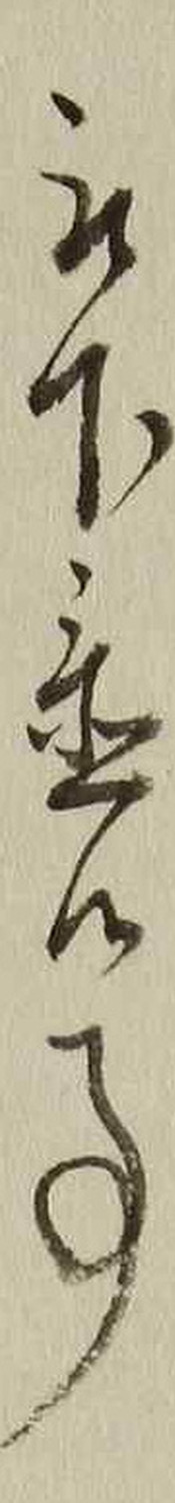被下置候事
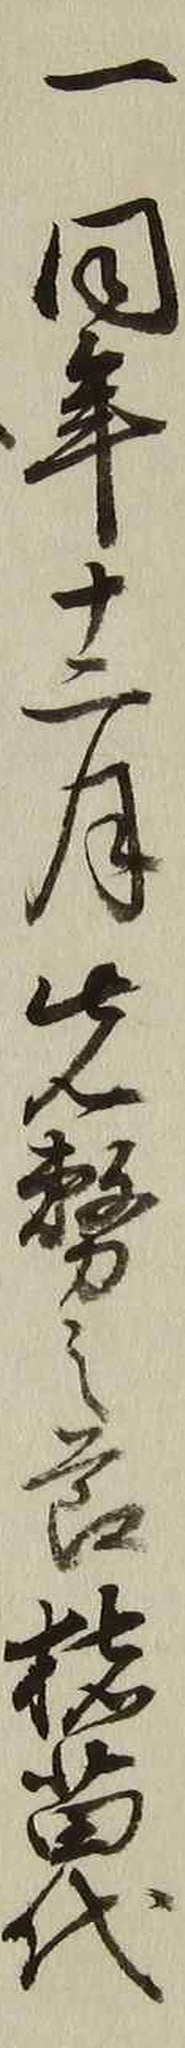一同年十二月先務之節猪苗代
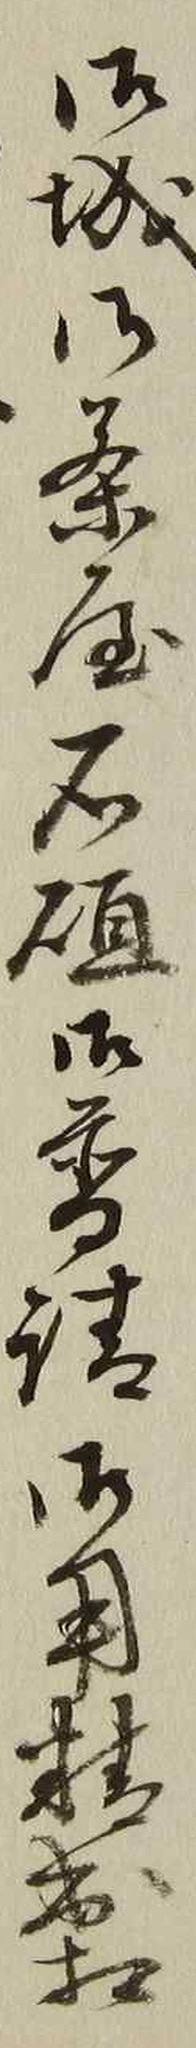御城御茶屋石御普請御用精出相
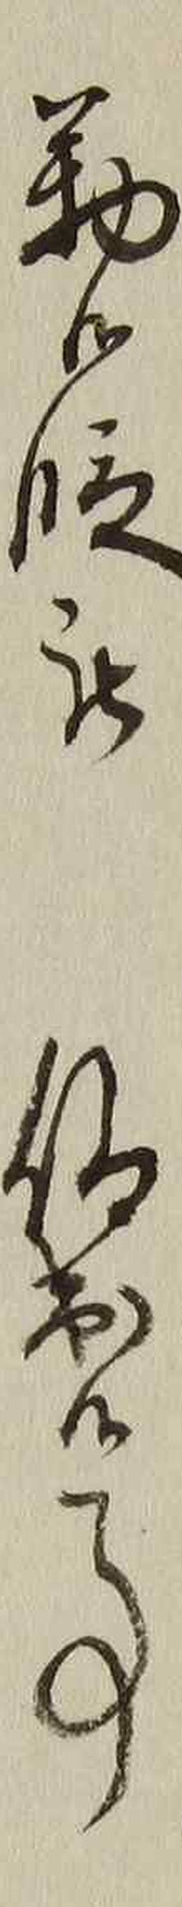勤候段被仰出候事
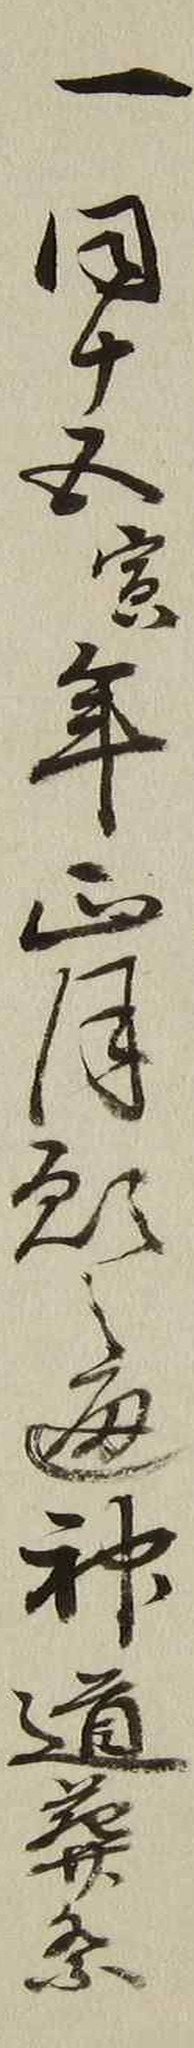一同十五寅年正月願之通神道葬祭
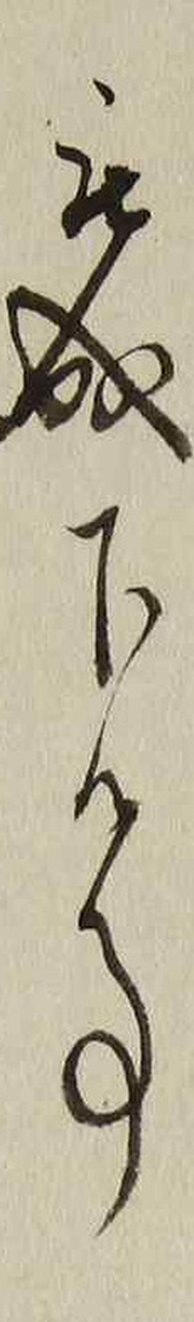被成下候事
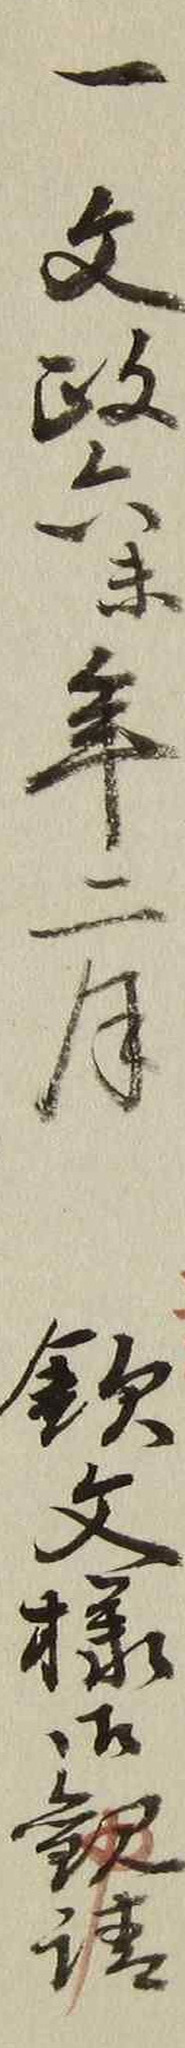一文政六未年二月欽文様御観請
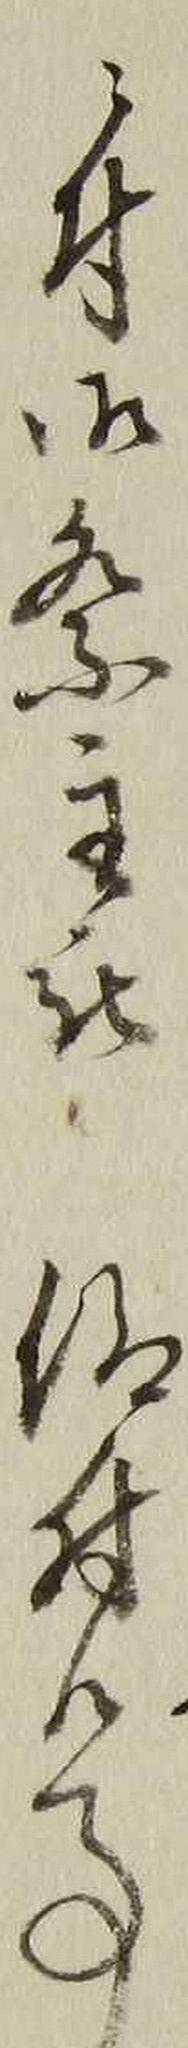ニ付御祭主被仰付候事
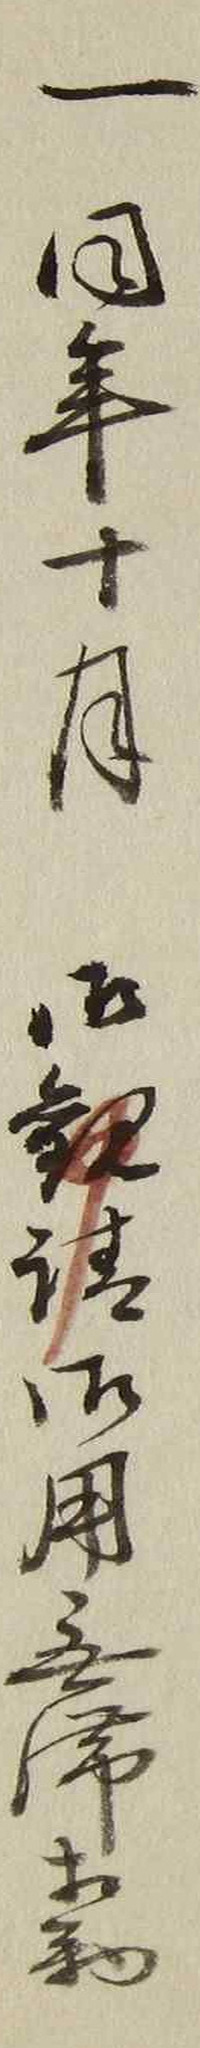一同年十月御観請御用無滞相勤
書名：諸士系譜　巻之35　は之部3
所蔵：会津若松市立会津図書館
